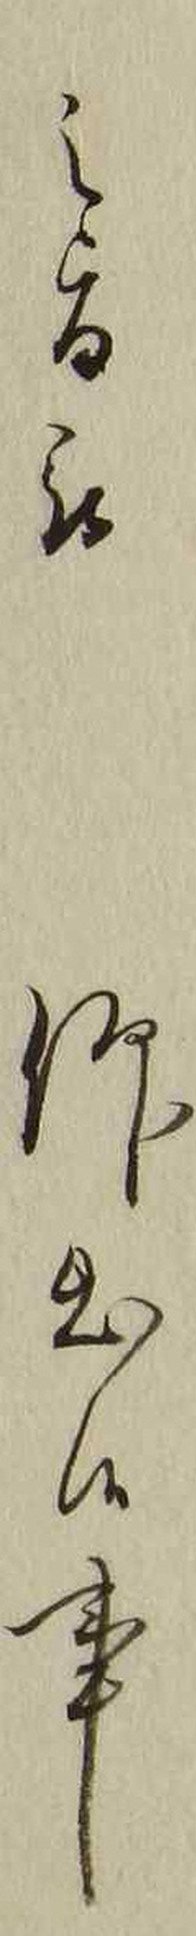之旨被仰出候事
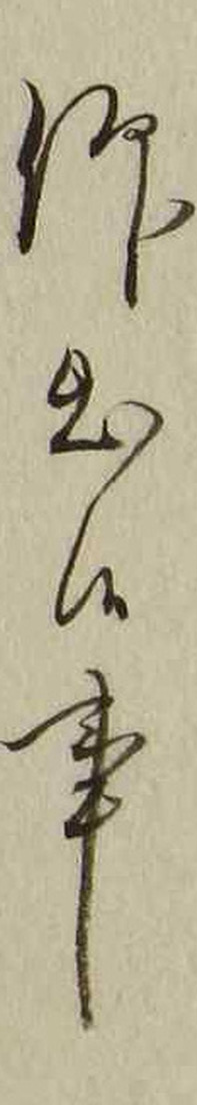仰付候事
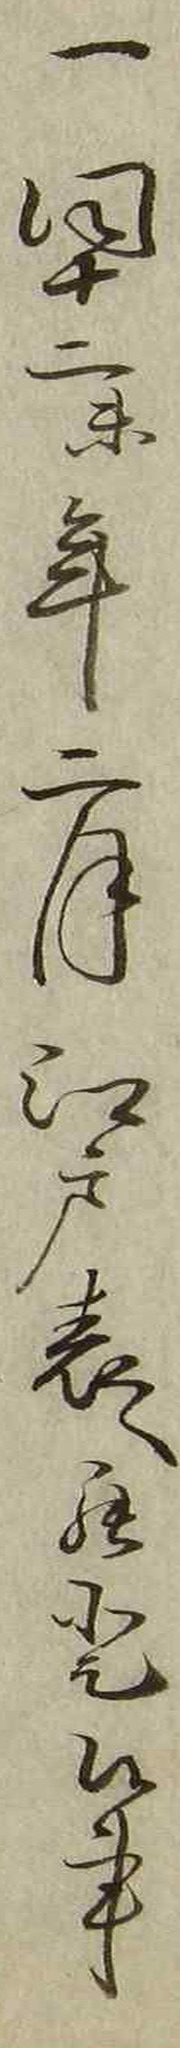一同十二未年二月江戸表へ罷登候事
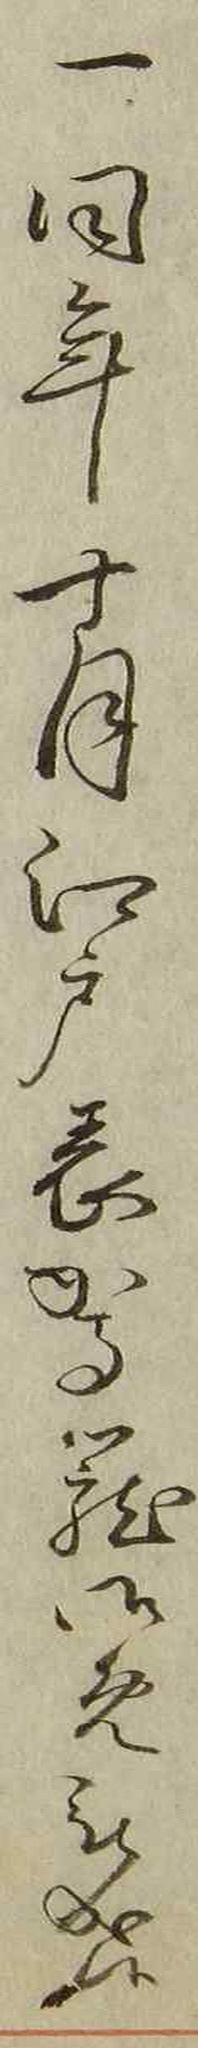一同年十月江戸表駕籠御免被成候
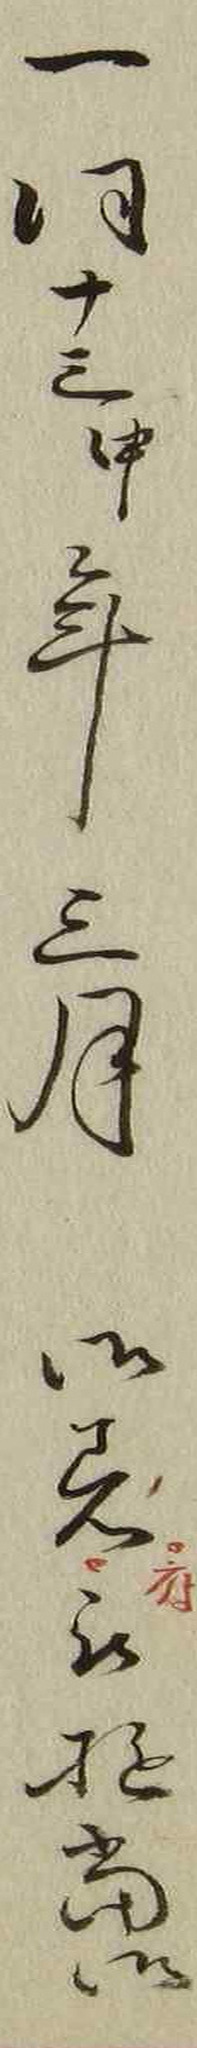一同十三申年三月御着◦府被遊当御
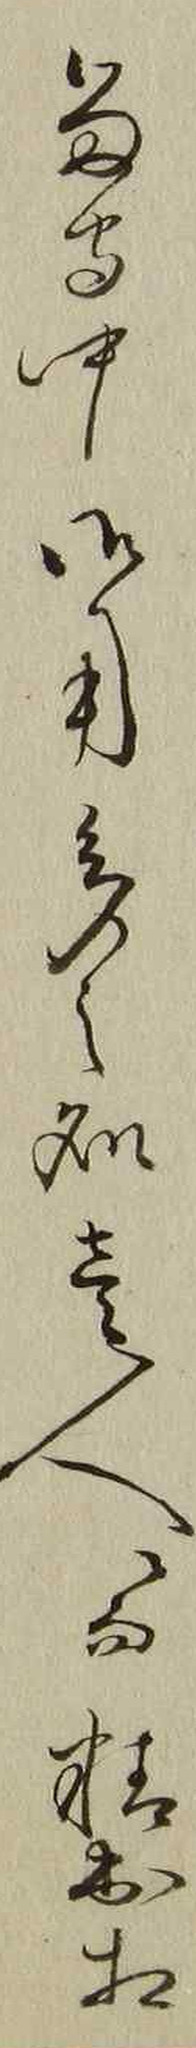留守中御用多之処壱人ニ而精出相
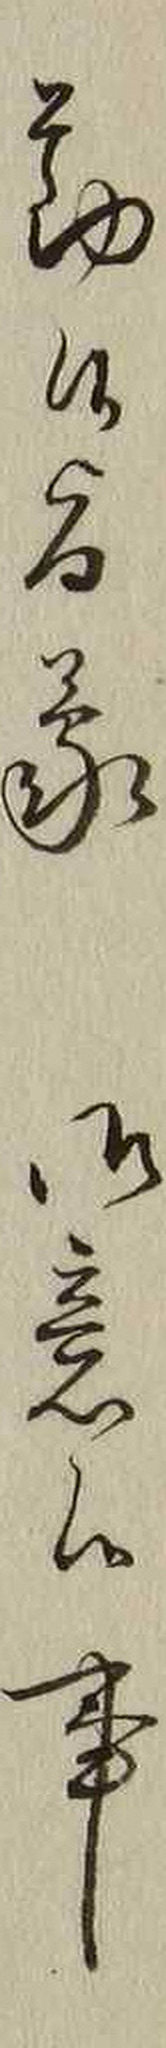勤候旨蒙御意候事
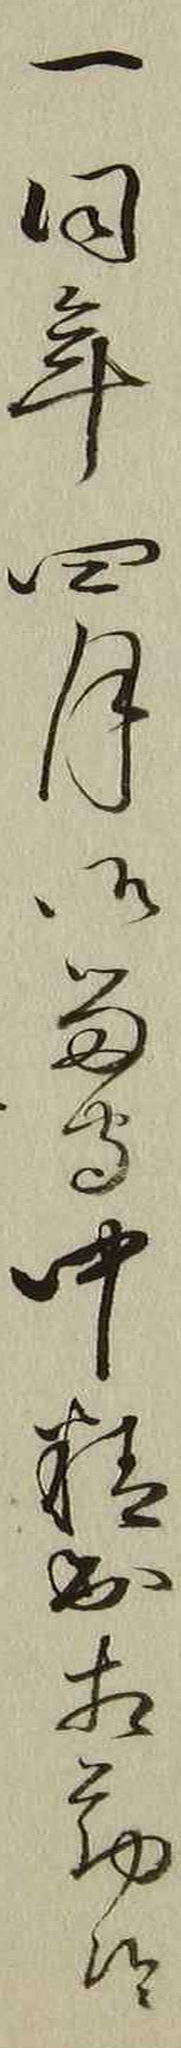一同年四月御留守中精出相勤候ニ
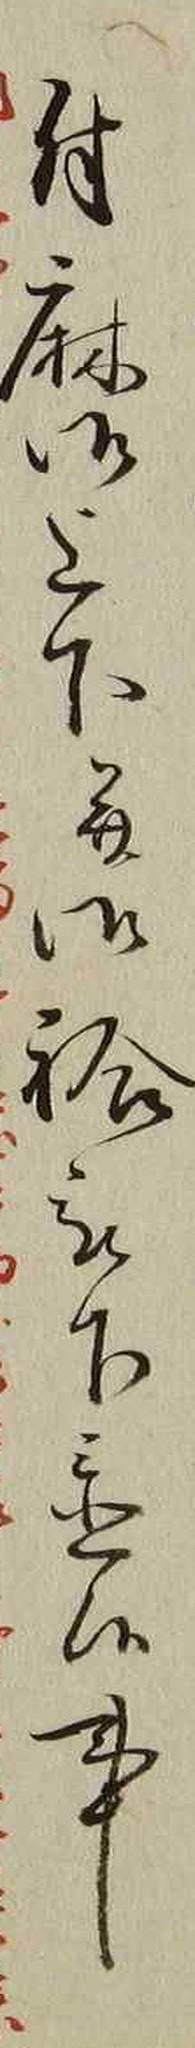付麻御上下并御袷被下置候事
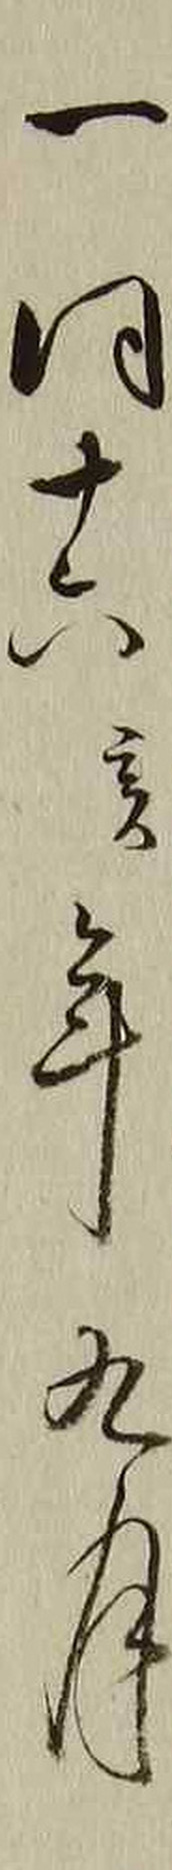一同十六亥年九月
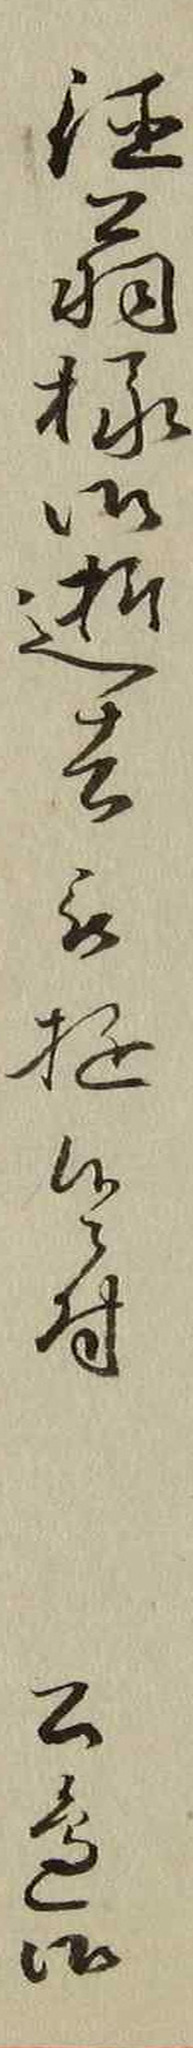徳翁様御逝去被遊候ニ付公辺御
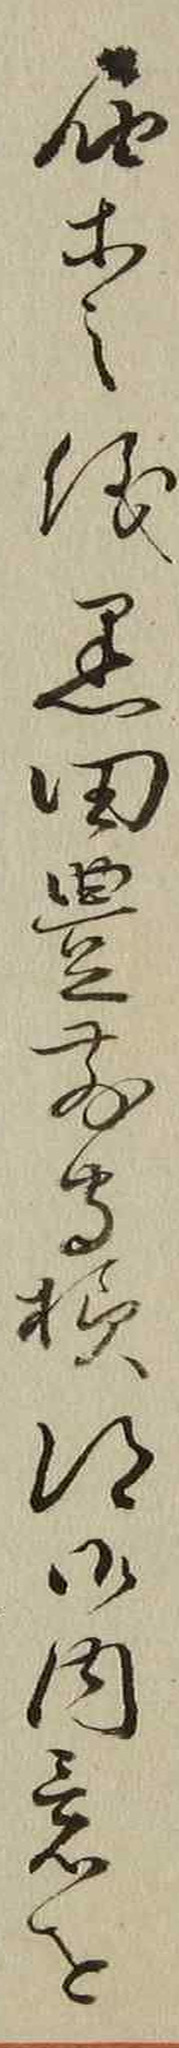届等之儀黒田豊前守様得御内意を
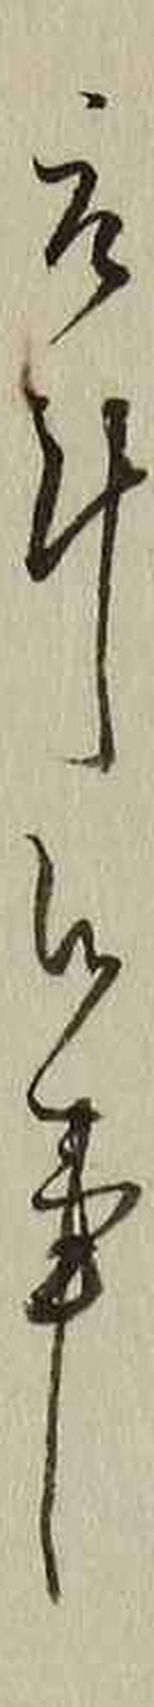取計候事
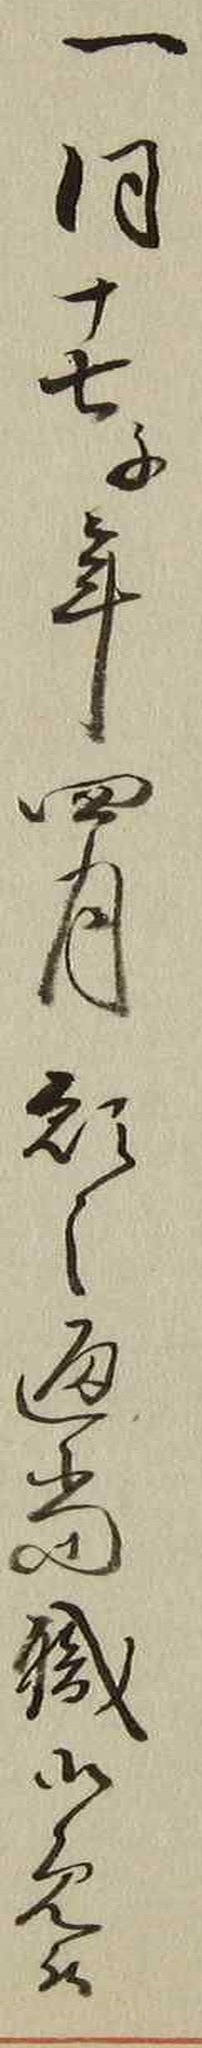一同十七子年四月願之通当職御免被
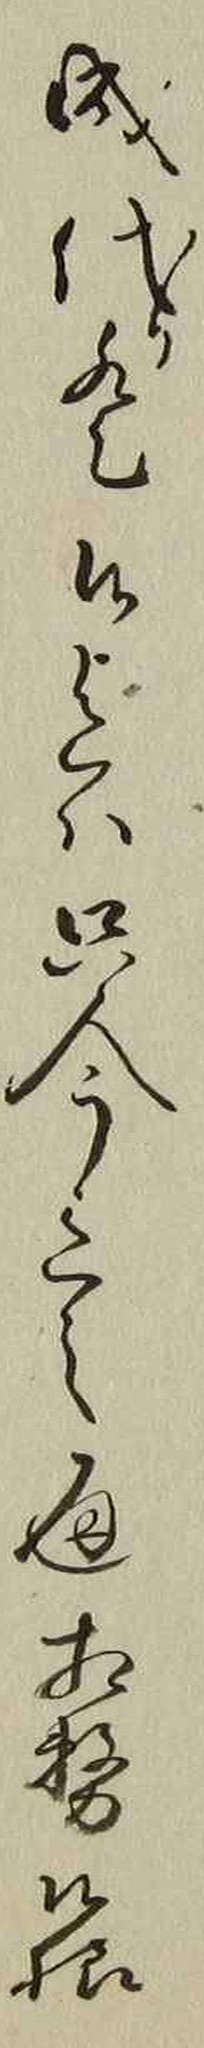成代り登候迄ハ只今迄之通相務候様
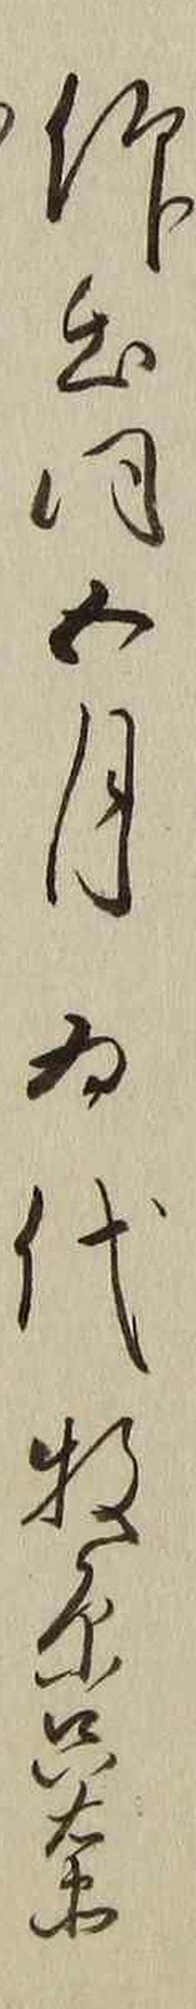被仰出同五月為代牧原只右衛
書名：諸士系譜　巻之2　い之部2
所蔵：会津若松市立会津図書館
